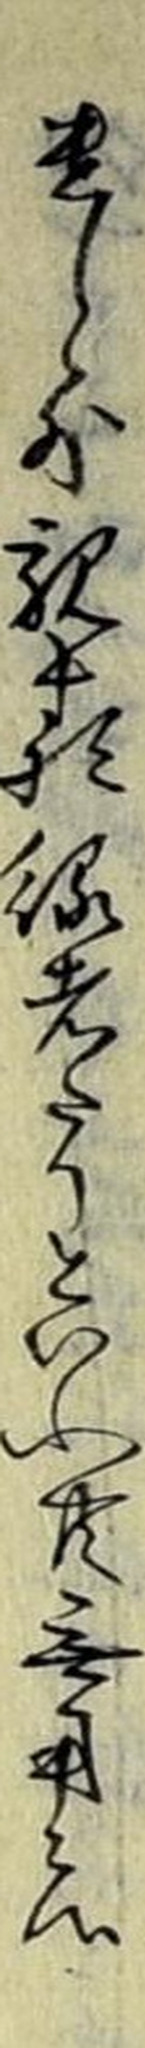遣し候外親類縁者たりといふ共無用ニ候
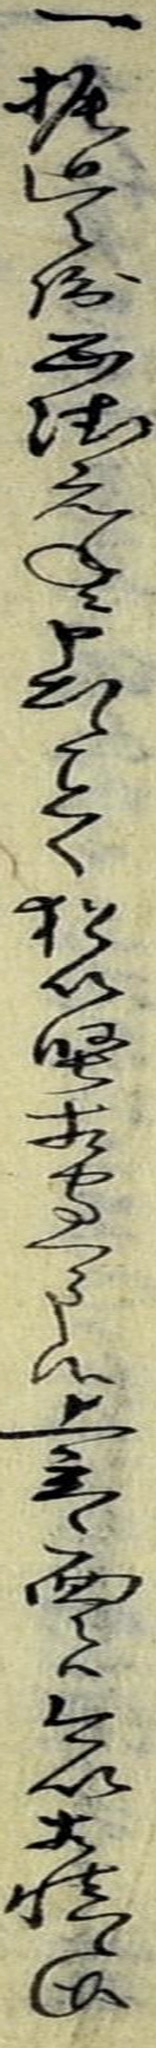一振廻之儀正徳元年ニ申出候ことく猶以堅相守可申候上立候之面々ハ今以相慎候趣
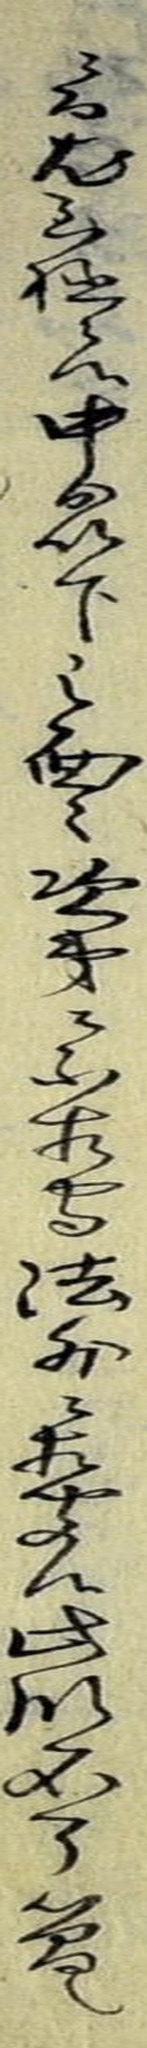ニ而尤至極ニ候中ゟ以下之面々次第ニ不相守法外ニ相聞候此段不了簡之
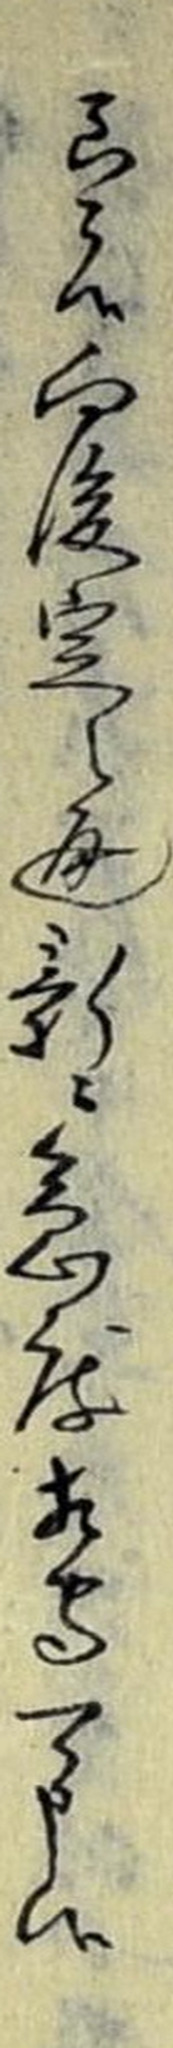至ニ候向後定之通新ニ急度相守可申候
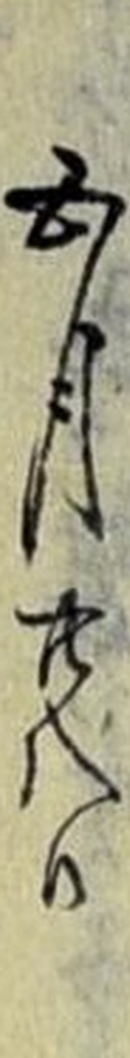五月廿八日
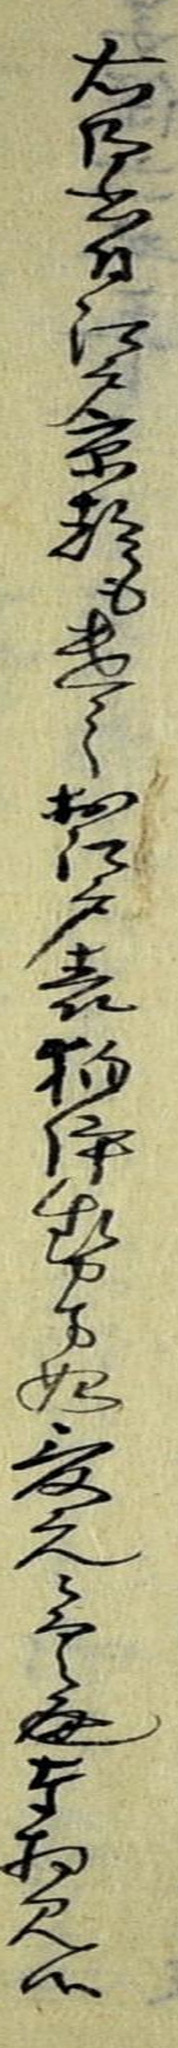右御書付江戸京都へも遣之於江戸表狛伊勢方始爰元ニ而之通奉拝見候
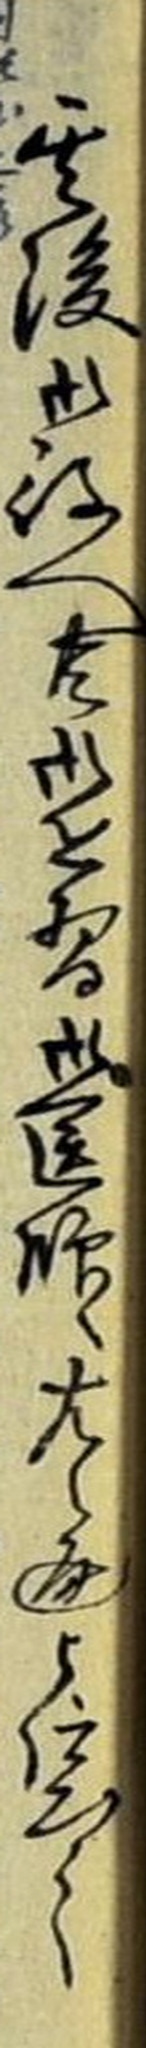其後御役人共御近習御医師へ左之通被仰出之
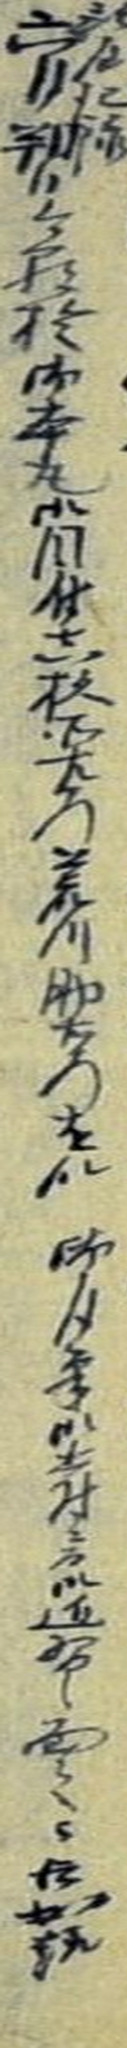六月朔日今朝於御本丸御目付真杉所左衛門荒川助右衛門を以御自筆御書付ニ而御近習之面々へ被仰出趣
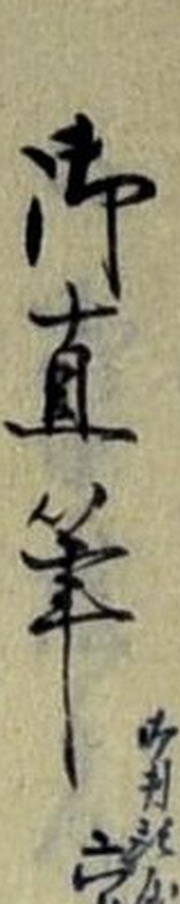御直筆
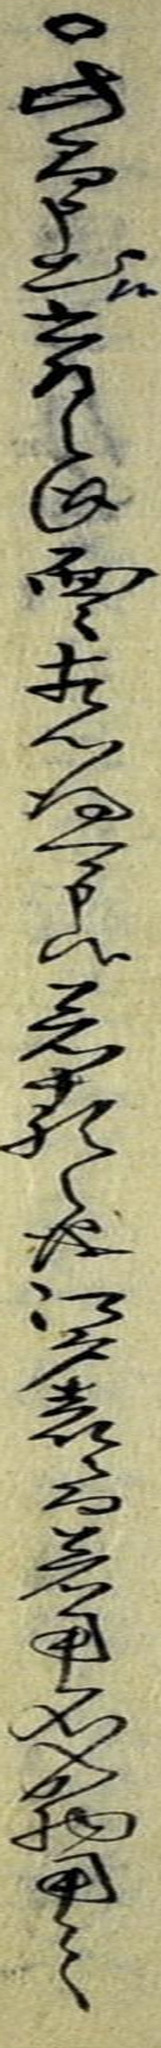〇此間申出候書付之趣面々相心得可申候着類之儀江戸表ニ而着用不成物用之
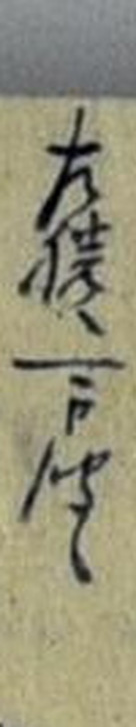左膳へ可申聞候
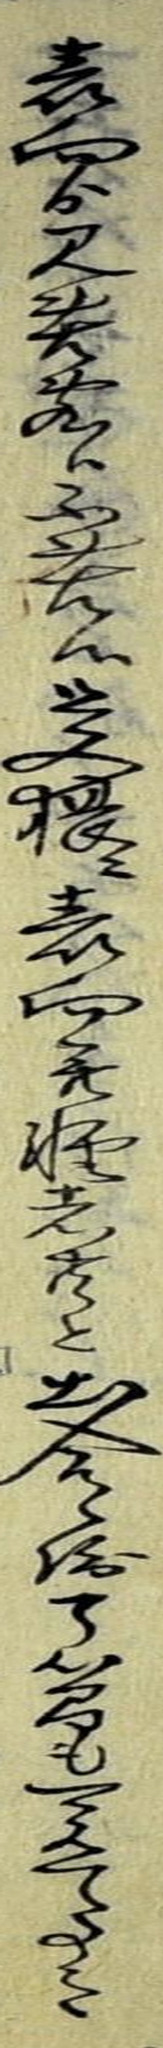表向ゟ見苦敷ハ不苦候且又猥ニ表向并軽者共と出合候儀了簡も可有之事ニ候
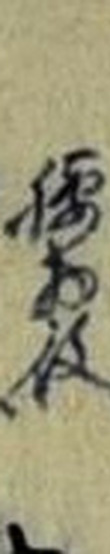腰物役
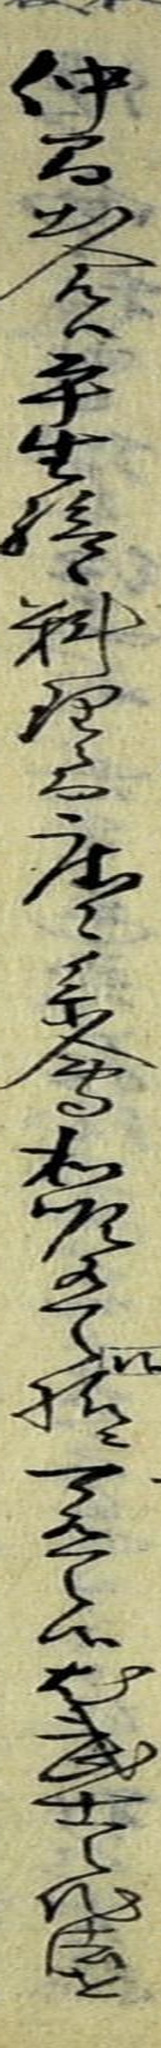仲間出合ハ平生給候料理ニ而参会和順有之候様ニ可有之候尤武士之作法を
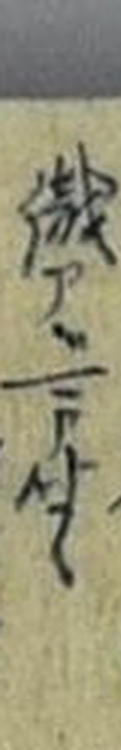織部へ可申聞候
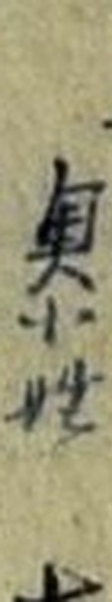奥小姓
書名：命令之部 一
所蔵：福井県文書館 Fukui Prefectural Archives
